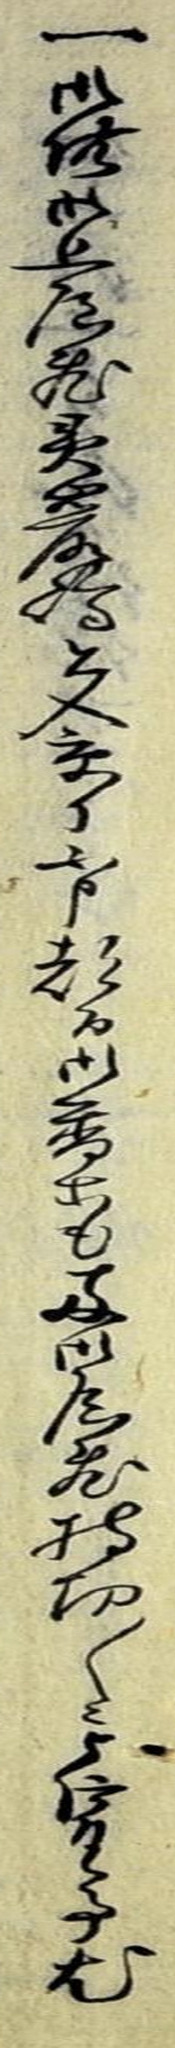一御供御上屋敷霊岸嶋と入交り不申都而御番等も両御屋敷持切〳〵に被仰付候事尤
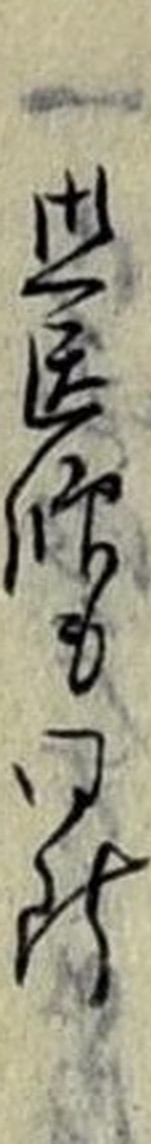御医師も同断
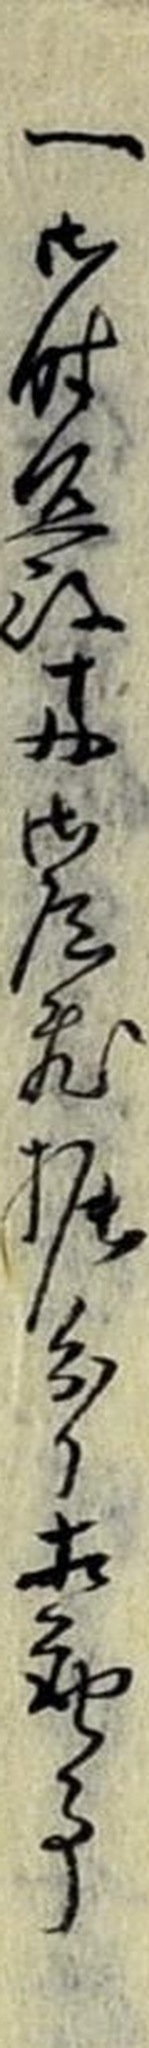一御時宜役両御屋敷振分り相勤候事
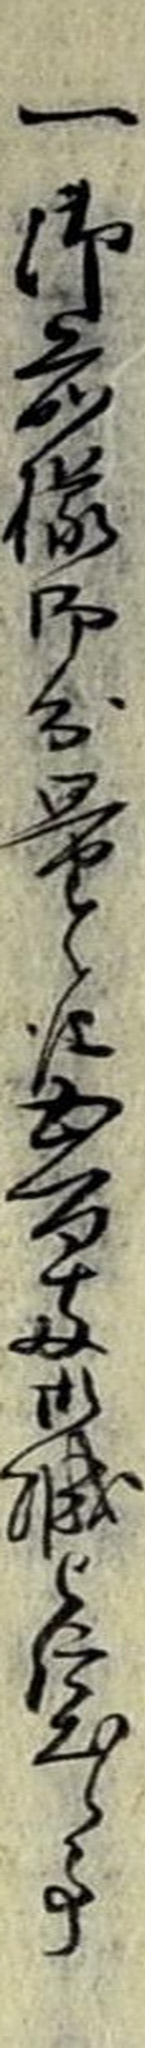一御前様御分量之儀五百両御減被仰出候事
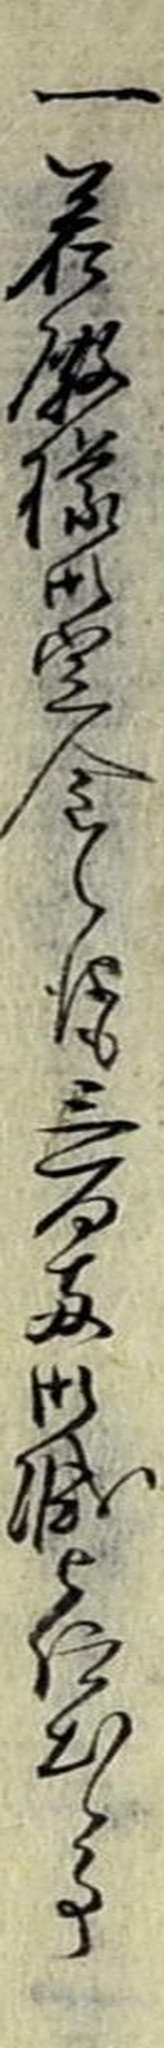一若殿様御定金之儀も三百両御減被仰出候事
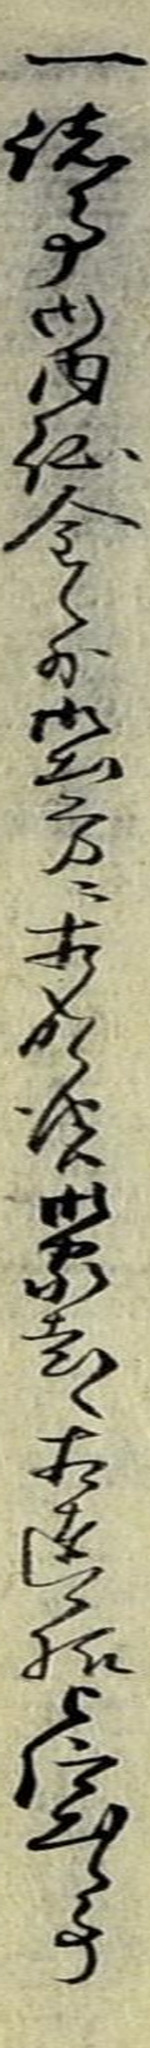一諸事御内証金之外御出方に相成候儀は御家老へ相達候様被仰出候事
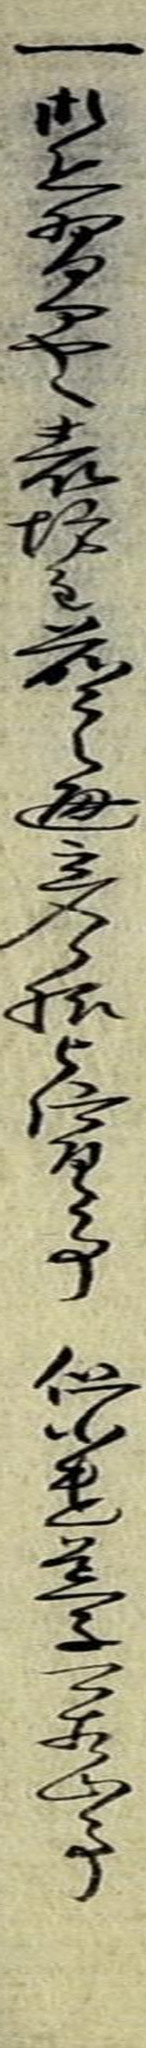一御近習部ヤへ表坊主前々之通立入候様被仰付候事但小遣荒子可相止事
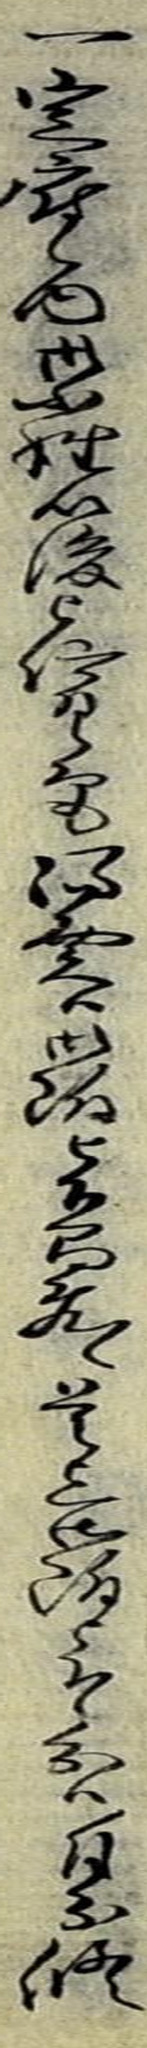一定府之内御小姓以後被仰付候而も湯殿は御附被下間敷候是迄御附被下分は自分修
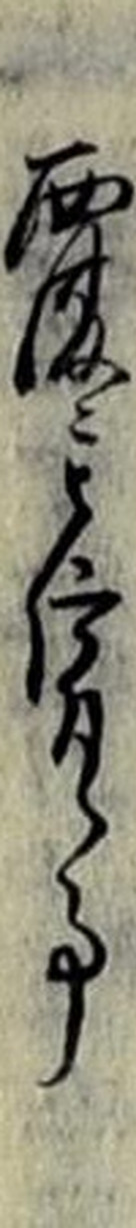覆に被仰付候事
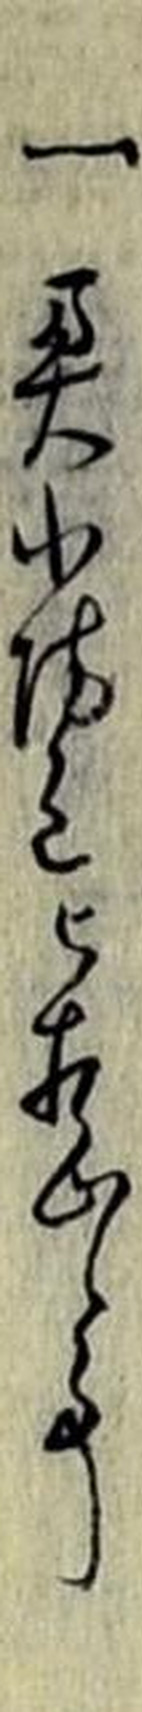一奥小坊主被相止候事
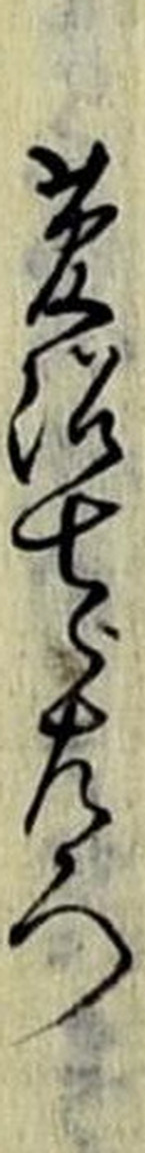菅沼七郎左衛門
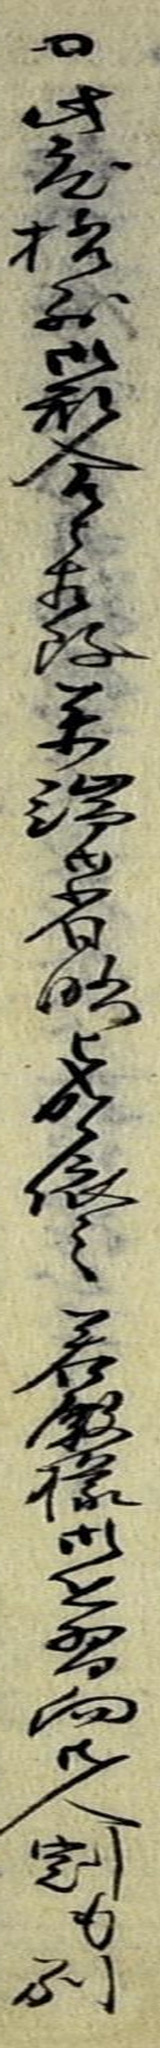〇此度格別御形合被相改万端御省略被成依之若殿様御近習向御人割も別
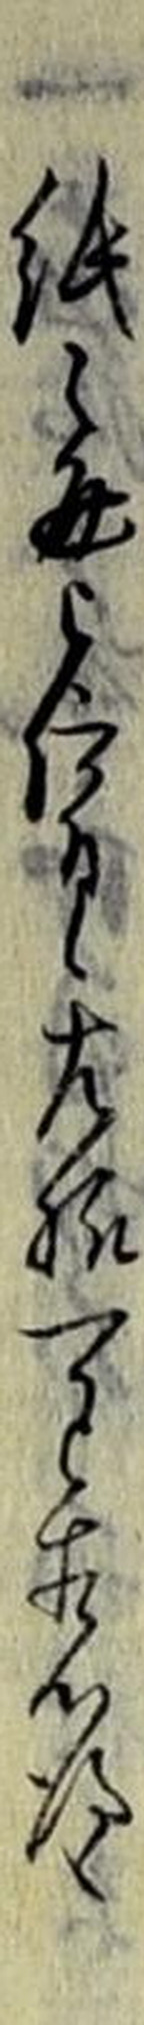紙之通被仰付候左様可被相心得候
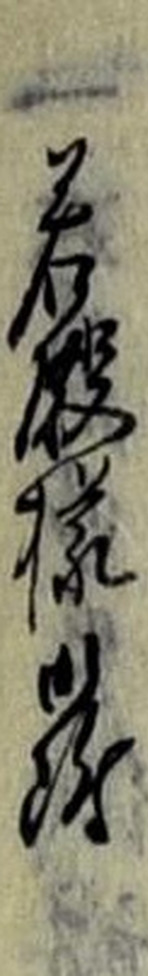若殿様御附
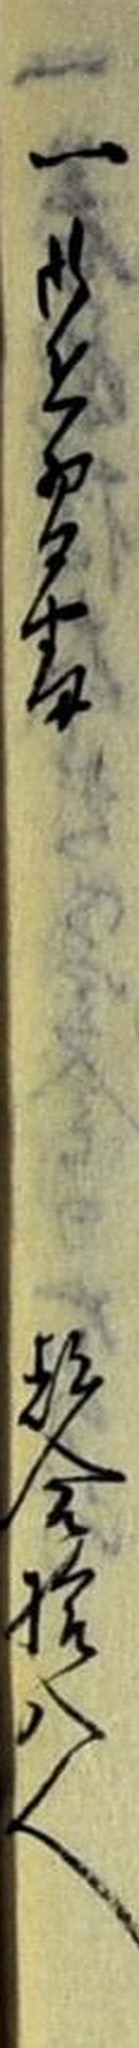一御近習番都合拾八人
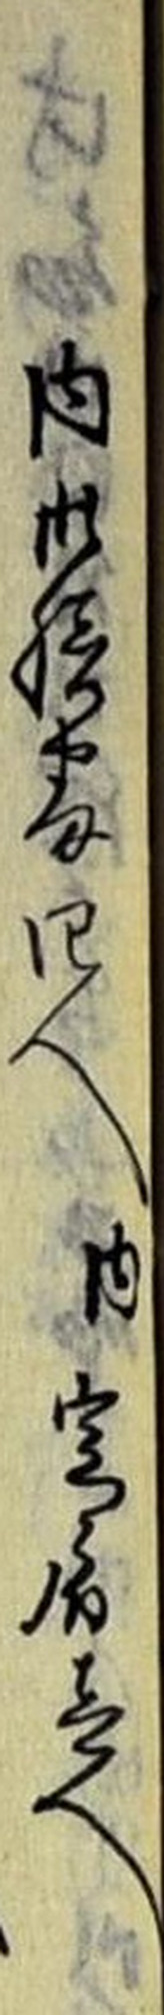内御膳番四人内定府壱人
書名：命令之部 二
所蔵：福井県文書館 Fukui Prefectural Archives
